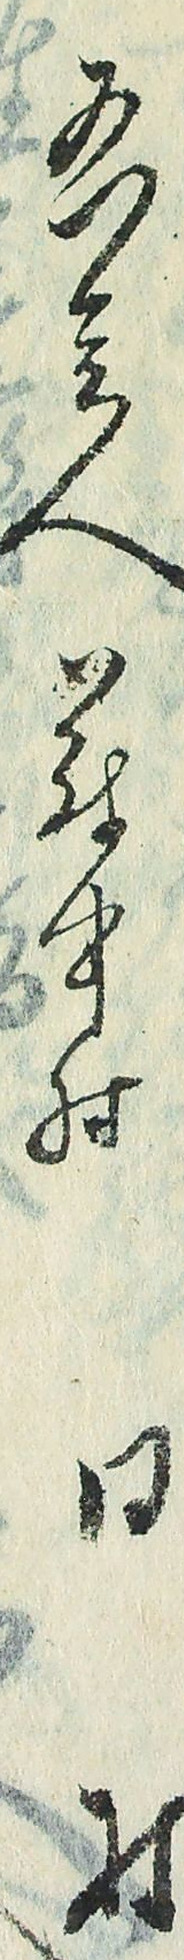右壱人府中村同村
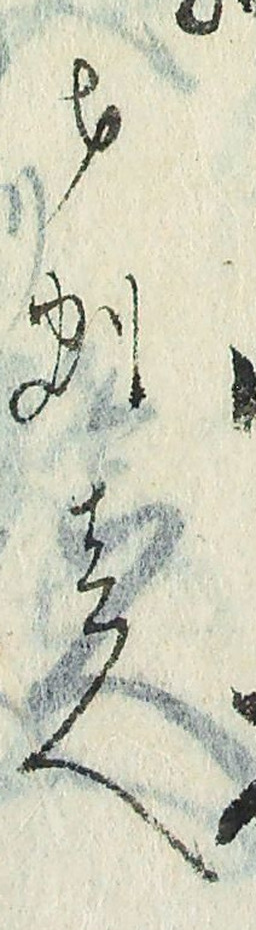才判壱人
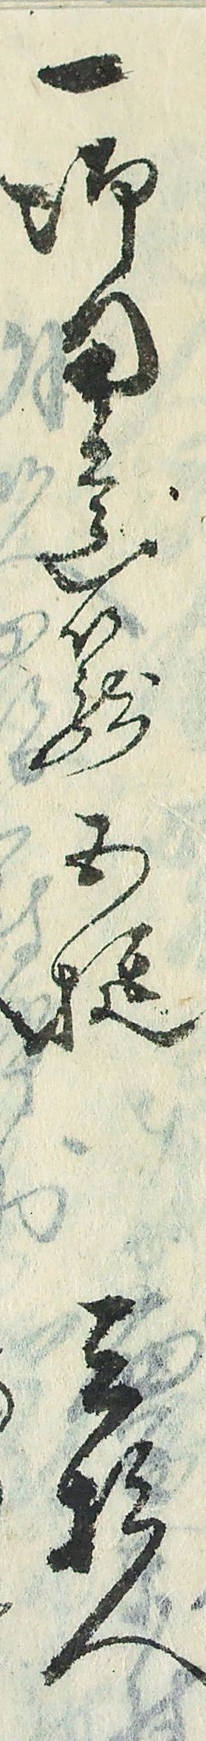一御用意籠五挺三拾人
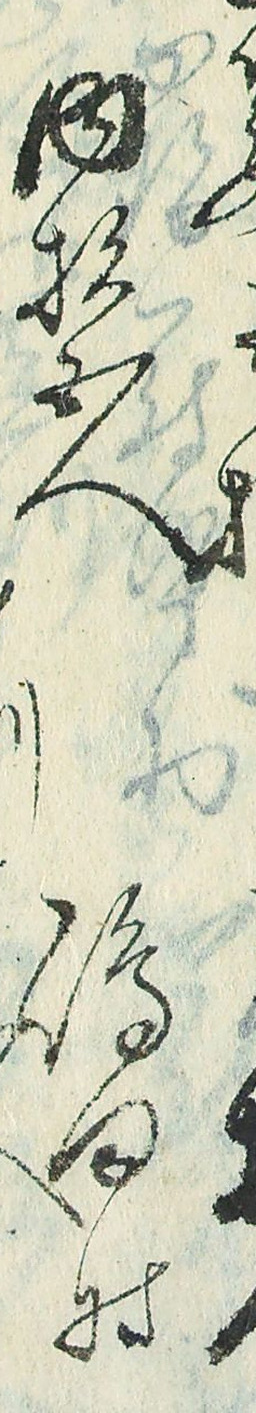内拾五人島田村
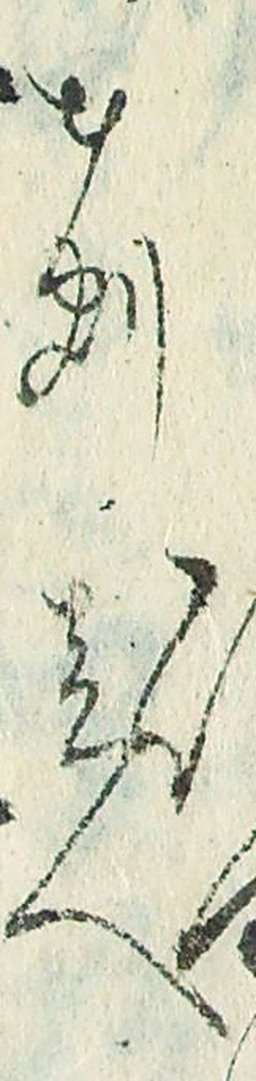才判壱人
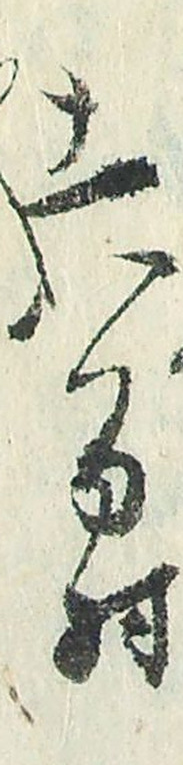上八万村

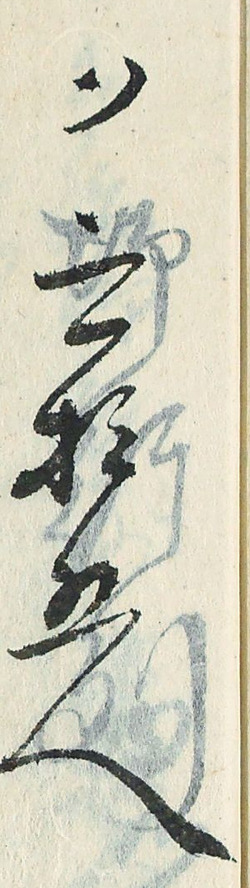〆六拾五人
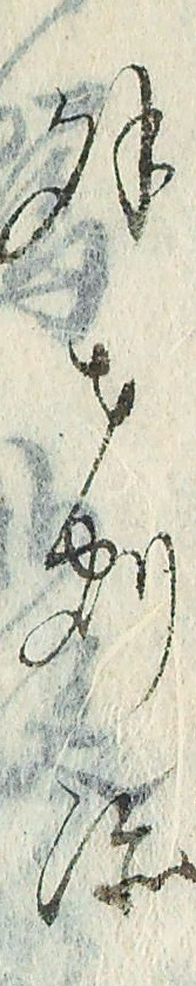外才判添
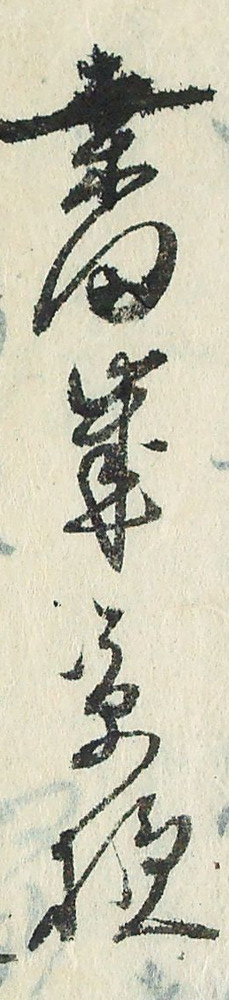桑田歳兵衛様
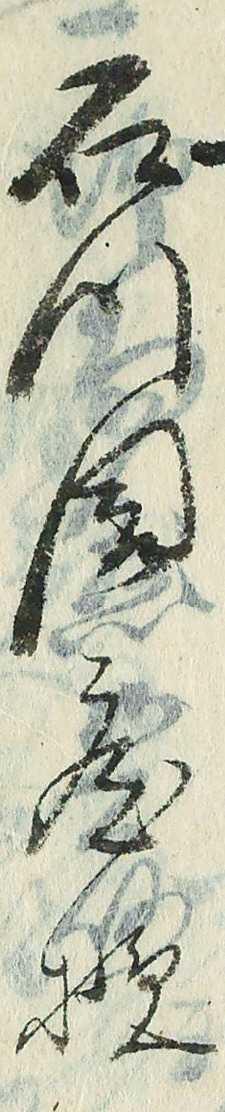石川周蔵様
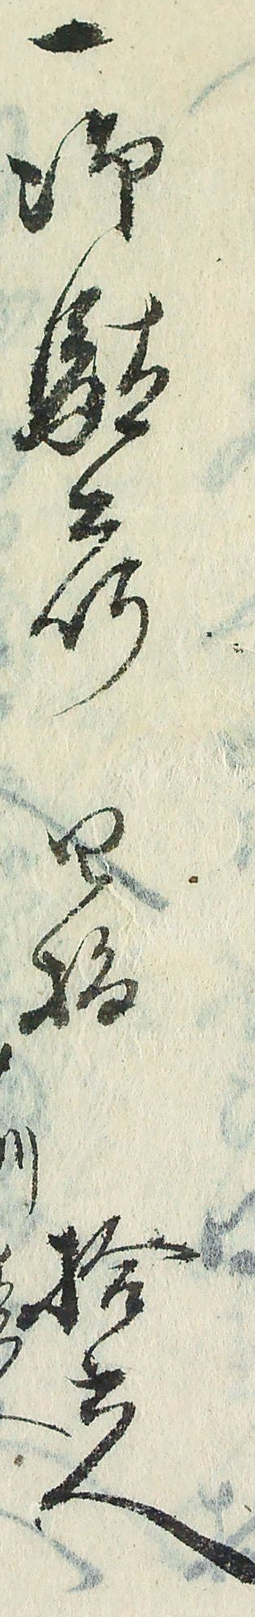一御駄荷四指拾六人
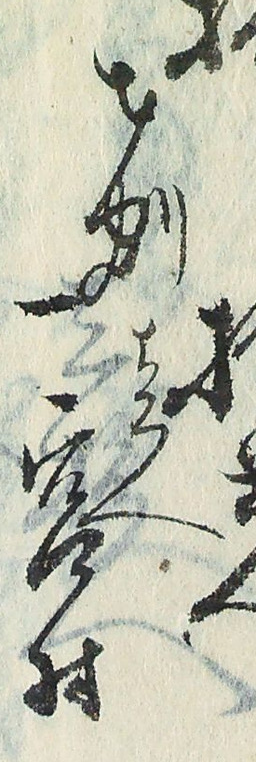才判壱人
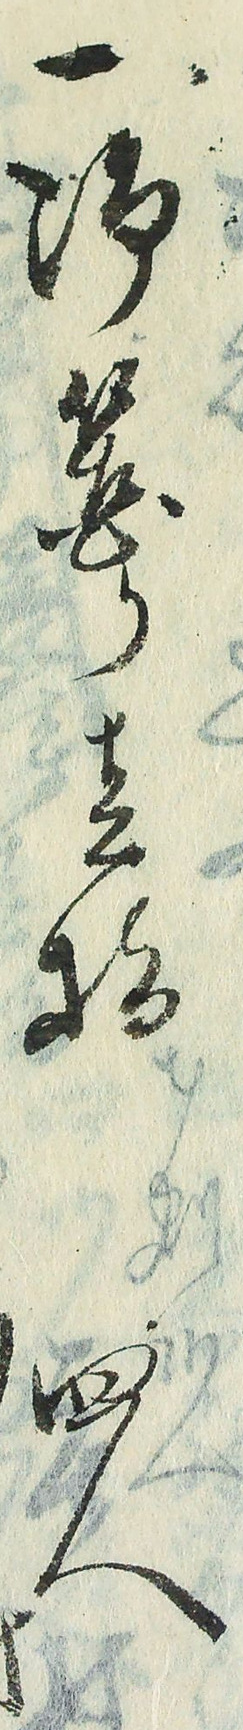一御箇り壱指四人
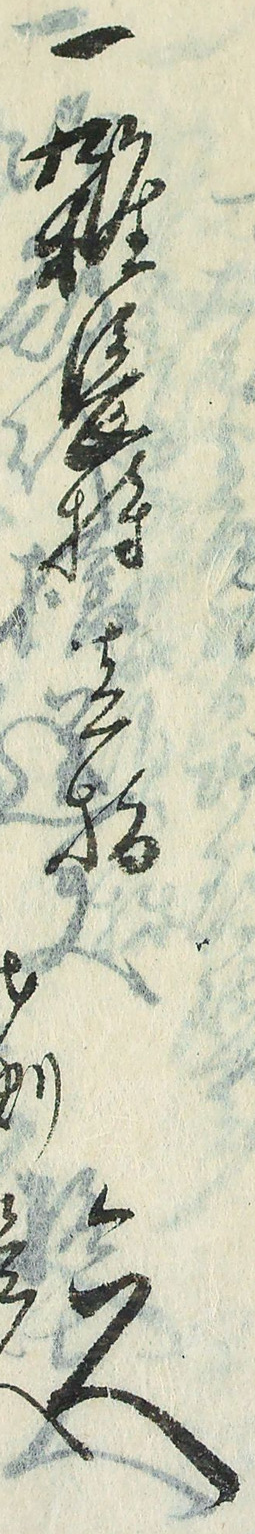一雑長持壱指六人
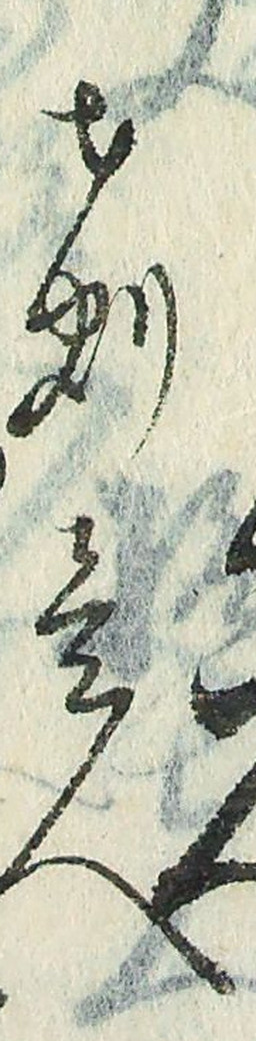才判壱人
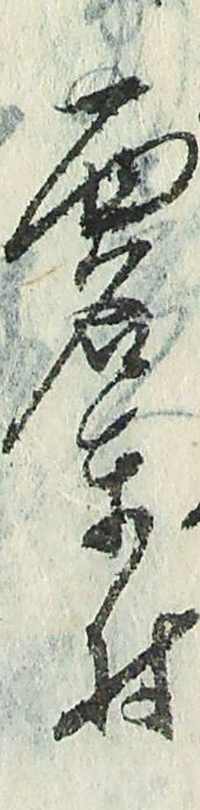西名東村
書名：公辺御役人為御廻浦御立越諸御用一巻
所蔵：鳴門教育大学 Naruto University of Education
